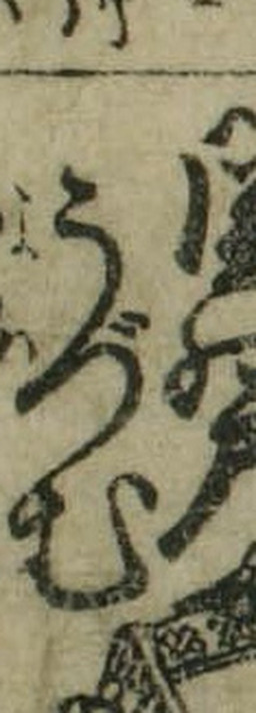うづむ
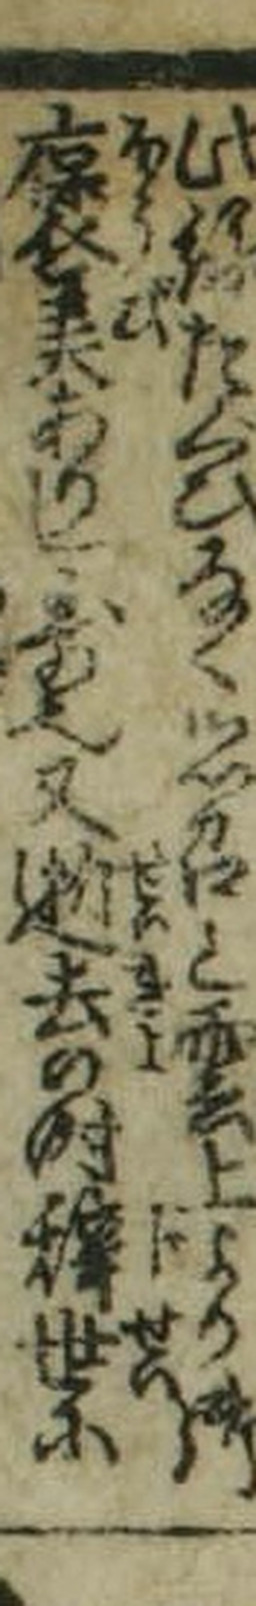褒美ありし哥也又逝去の時辞世に
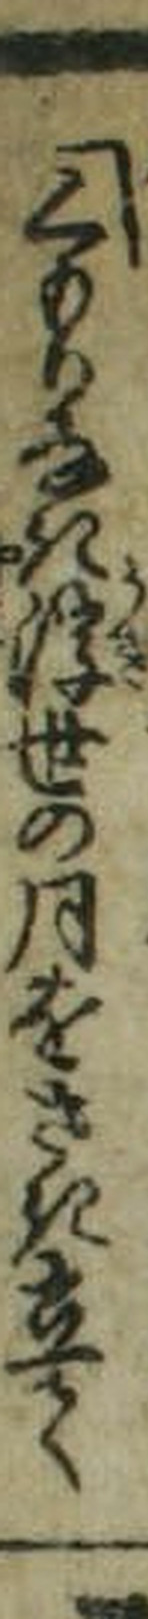〽くもりなき浮世の月をさき立て
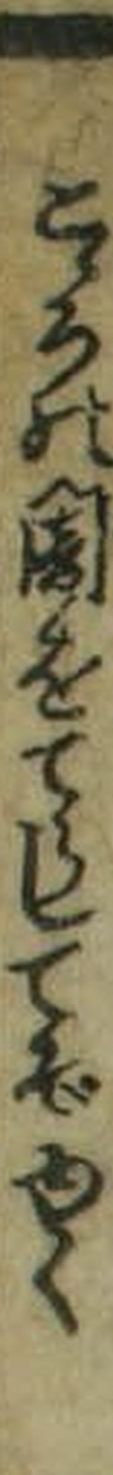こゝろの闇をてらしてぞゆく
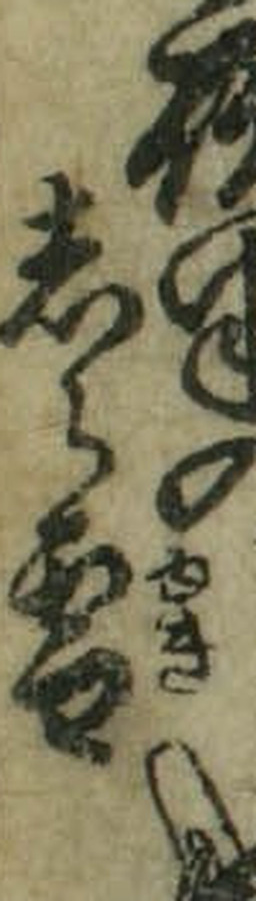しら雪

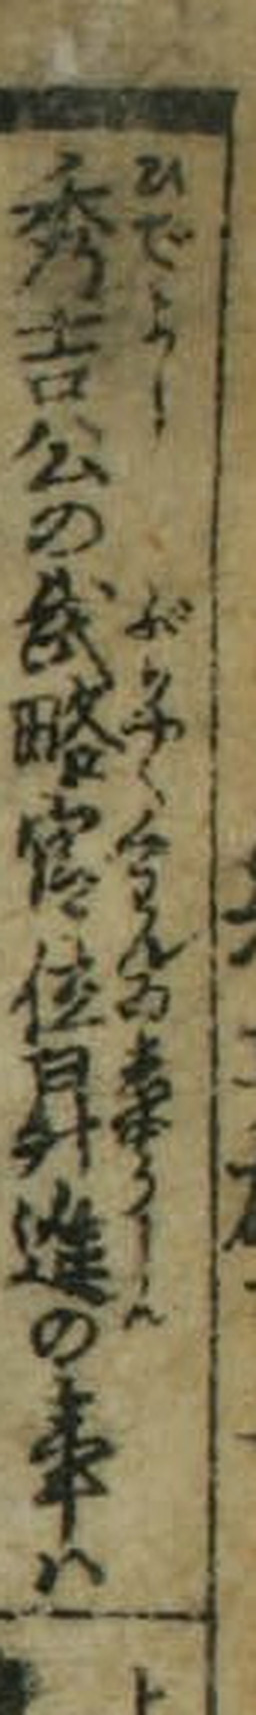秀吉公の武略官位昇進の事は
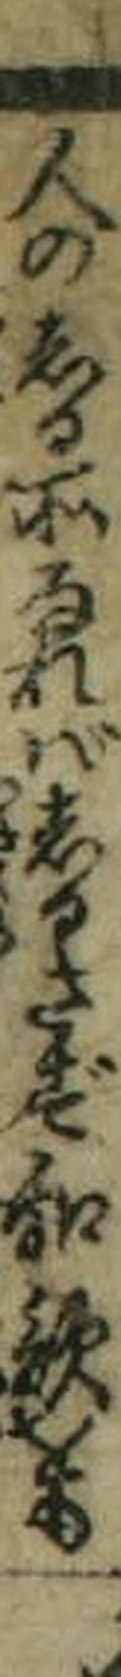人のしる所なればしるさずば和歌をも
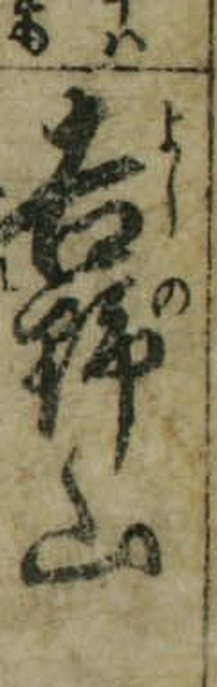吉野山
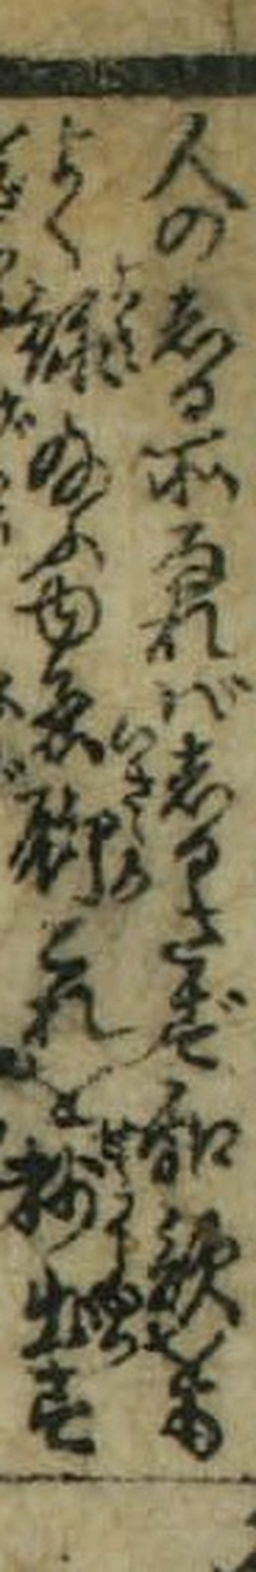よく詠給ふゆゑ聊これを抄出す
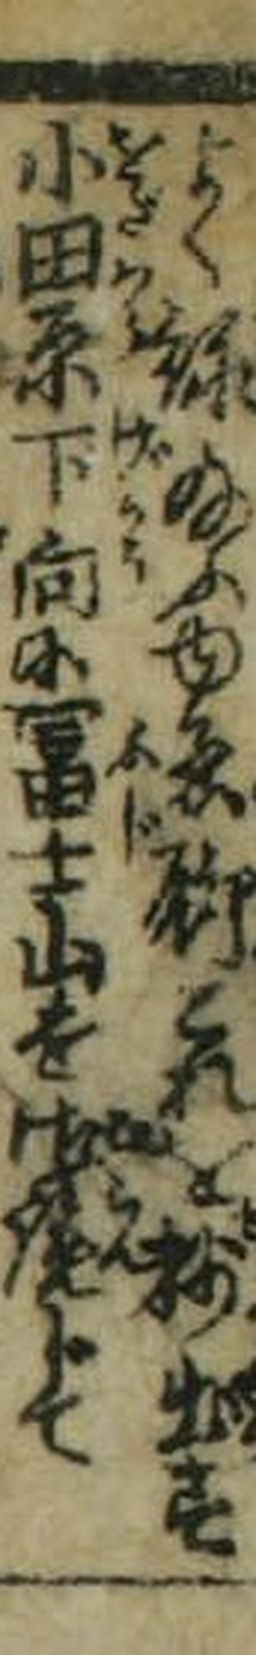小田原下向に冨士山を御覧じて
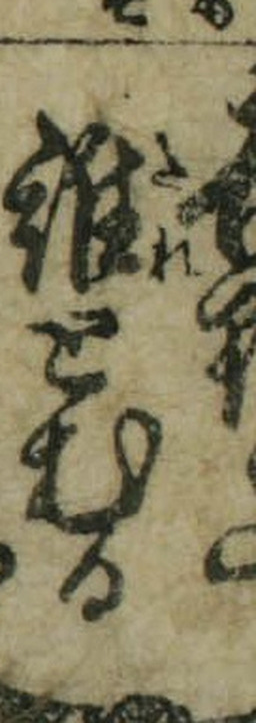誰とむる
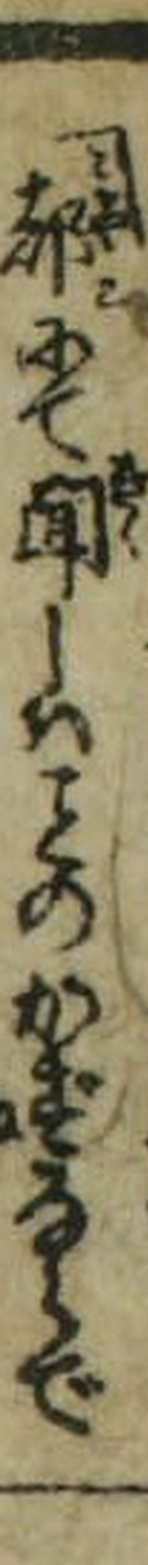「都にて聞しはことのかずならで
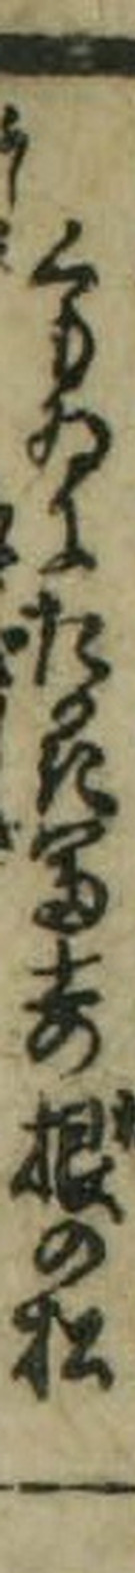くもゐにたかき冨士の根の松
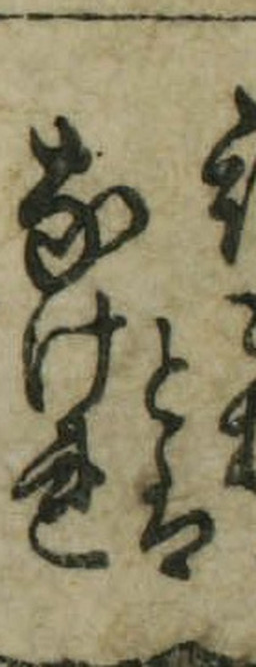なけれ
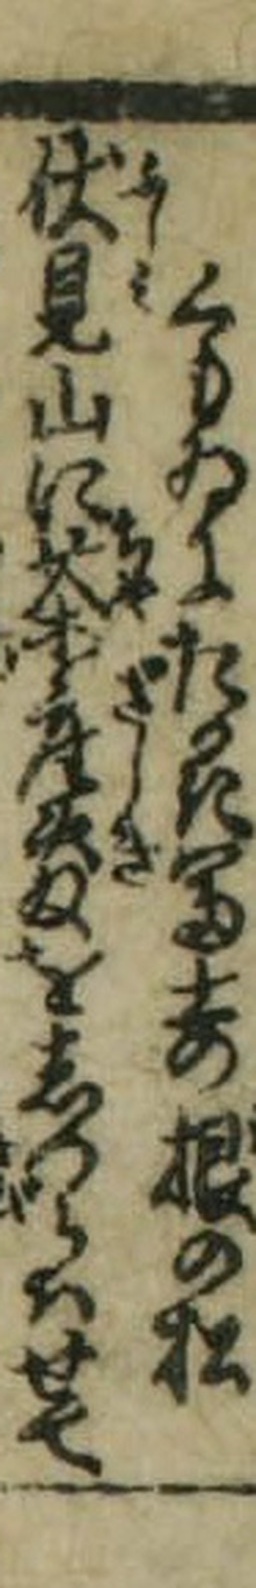伏見山に茶座敷をしつらはせて
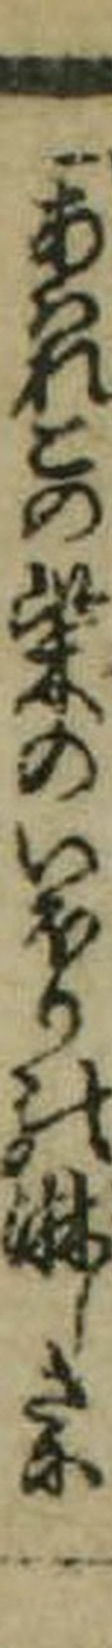「あはれこの柴のいほりの淋しさに
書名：續英雄百人一首
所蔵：東京学芸大学附属図書館
